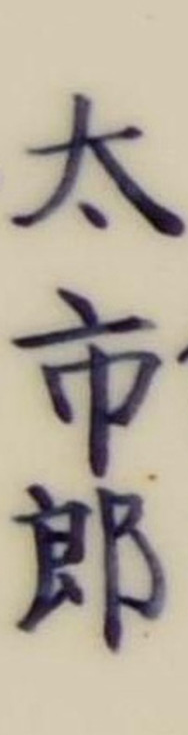太市郎
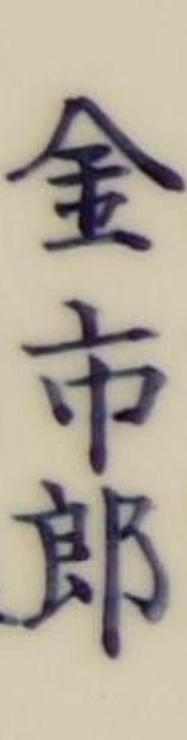金市郎

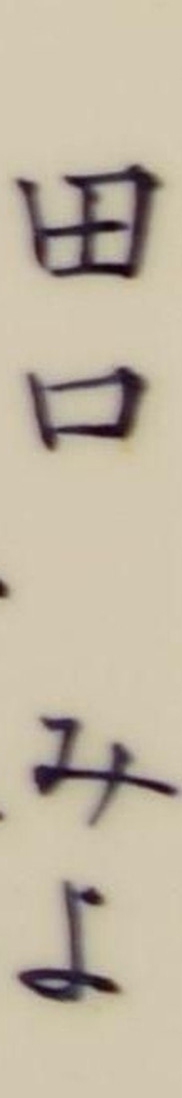田口みよ
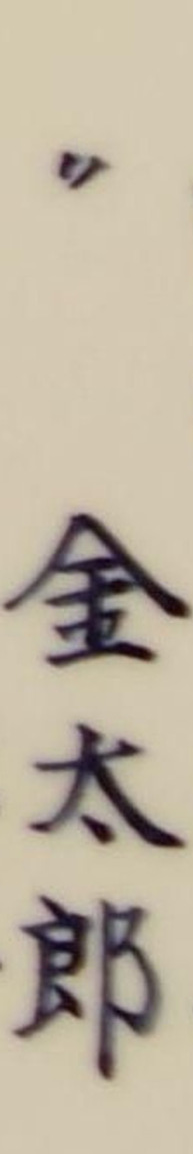金太郎
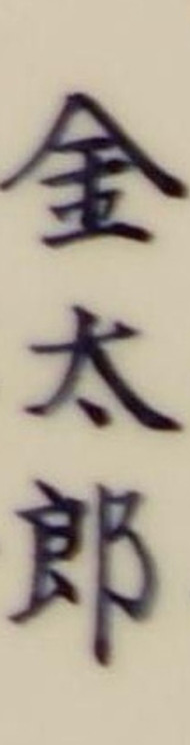金太郎
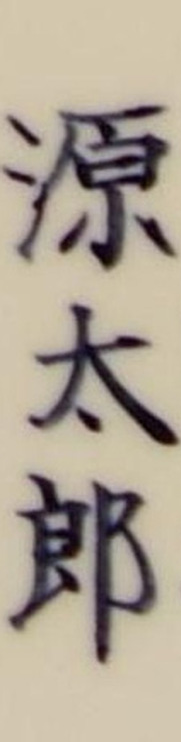源太郎
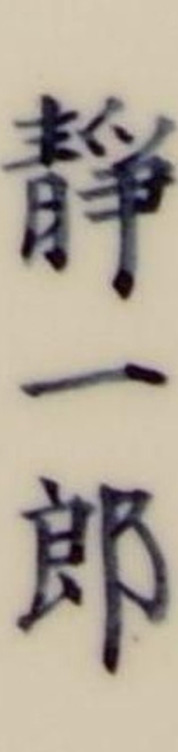静一郎
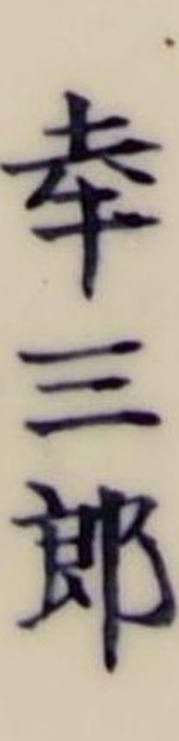幸三郎
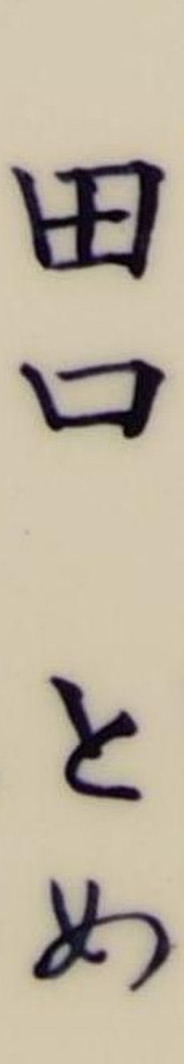田口とめ

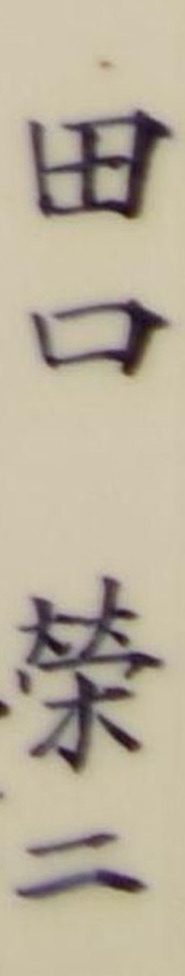田口榮二
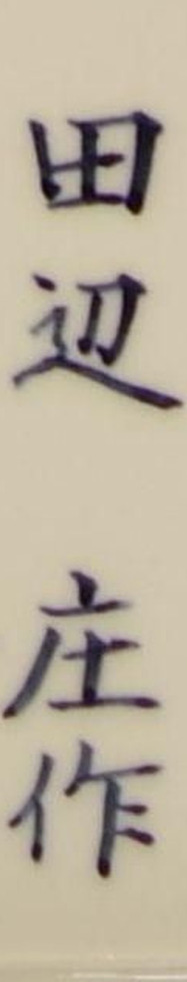田辺庄作
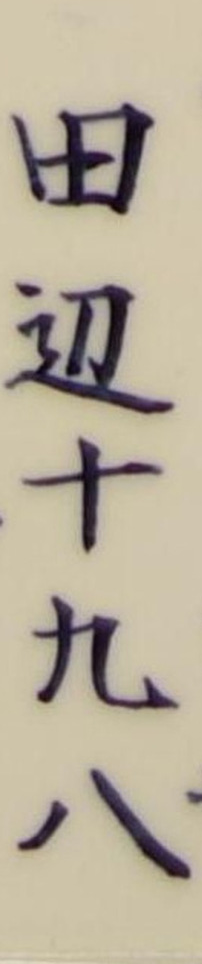田辺十九八
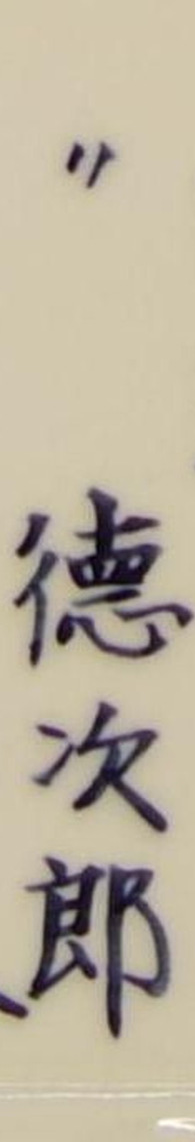徳次郎
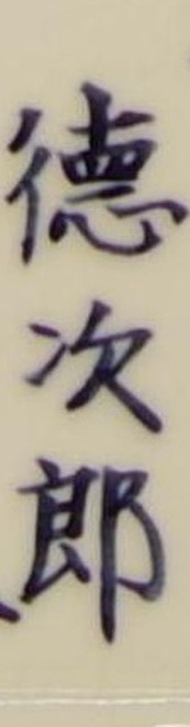徳次郎
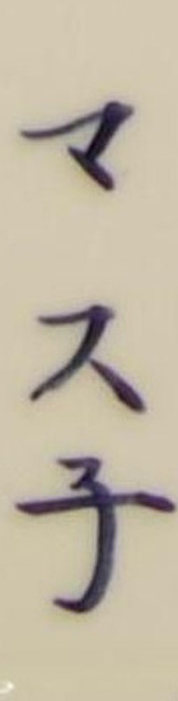マス子
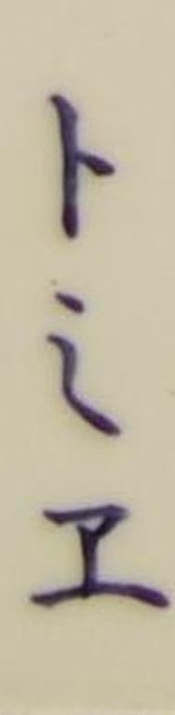トミ工
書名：A~D
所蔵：koyasan kongobuji
